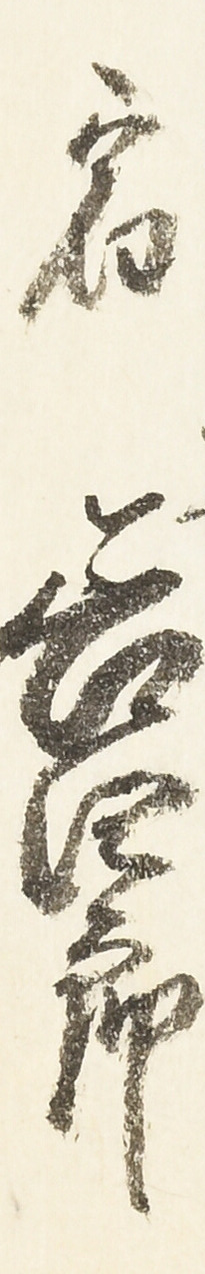宿善四郎
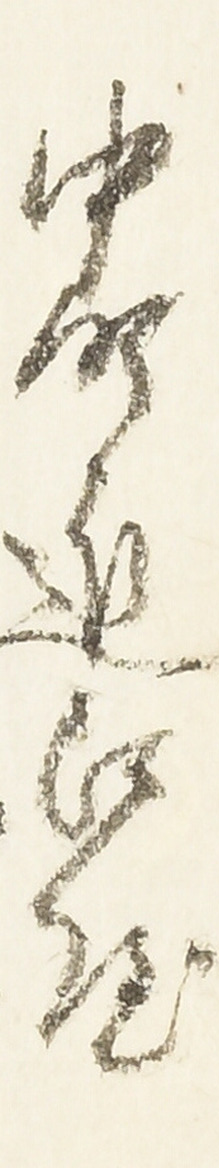中町近江屋
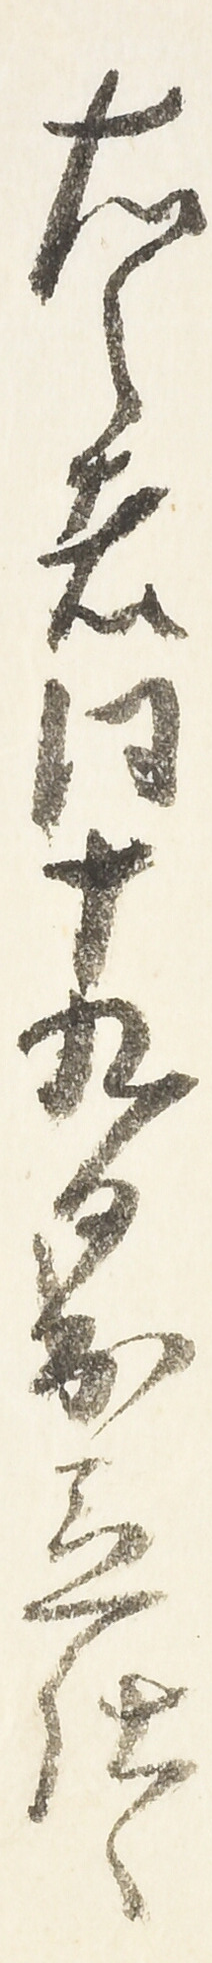右之者同十九日出立仕候
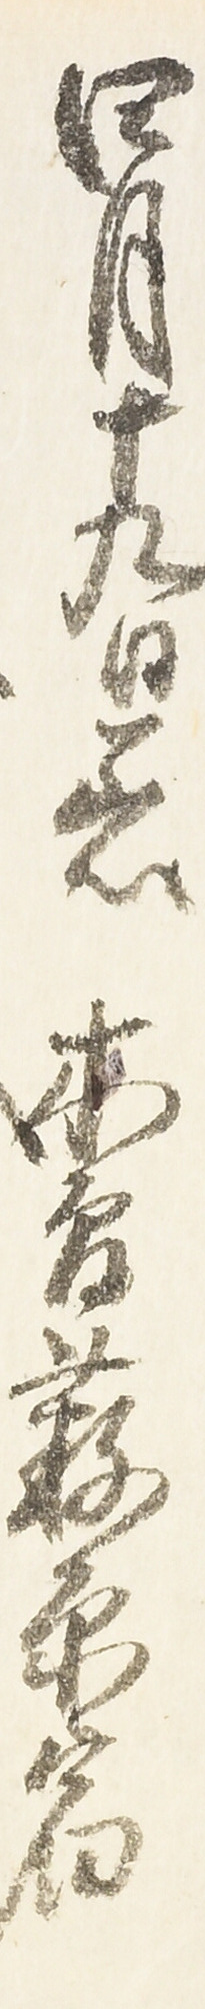四月十九日着木曽藪原宿
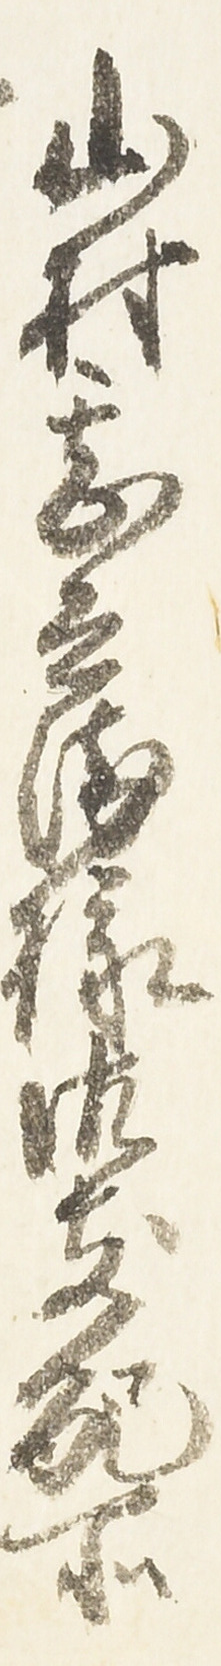山村甚兵衛様御支配所
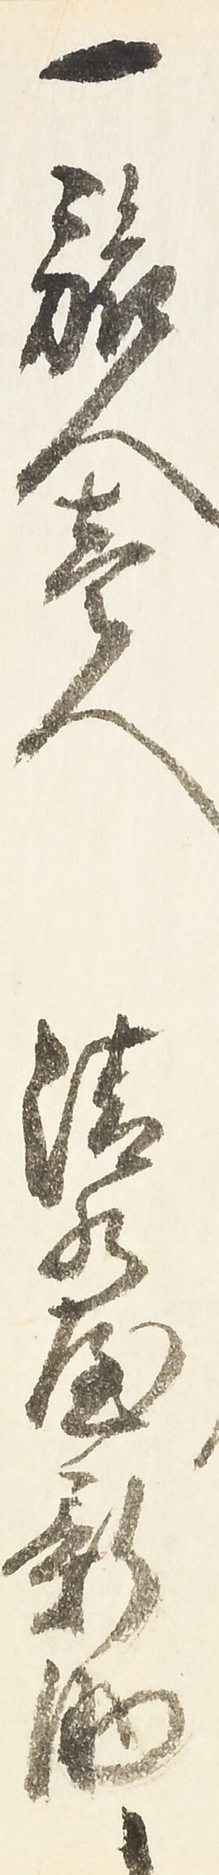一旅人壱人清水屋新助・
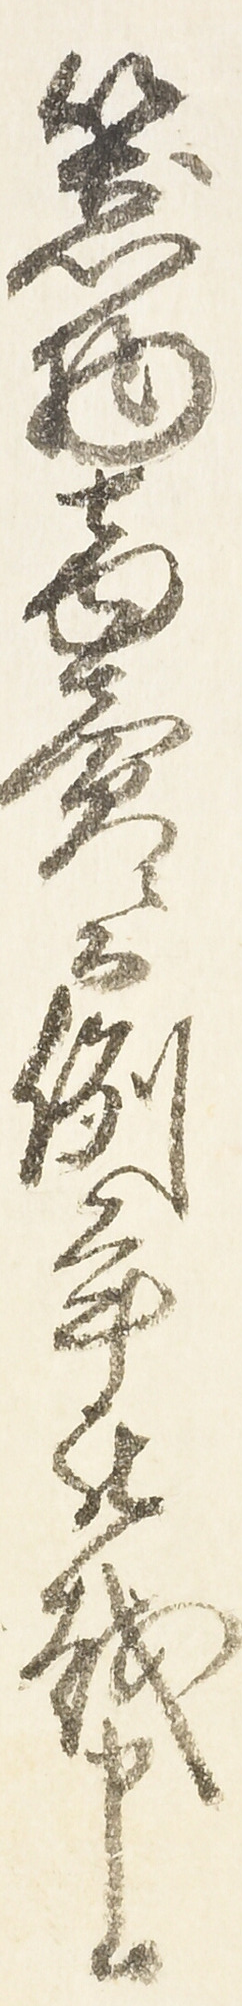器物商売ニ而例年罷越申候
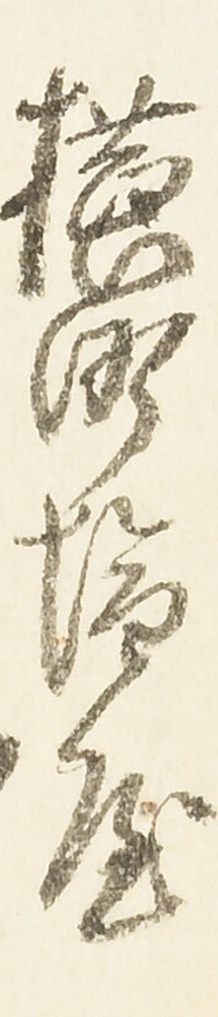横町塩屋
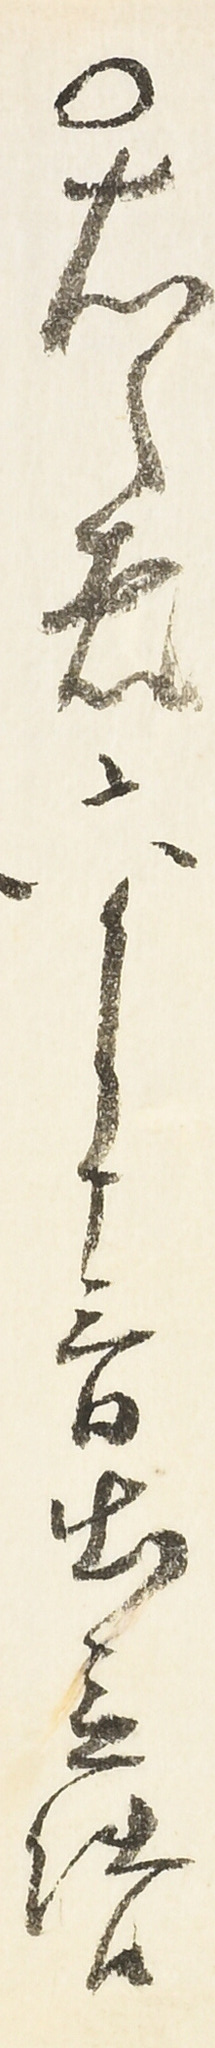〇右之者六月十三日出立仕候
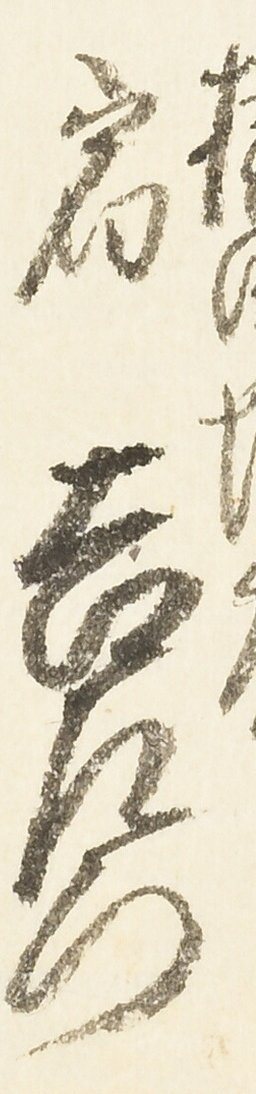宿吉左衛門
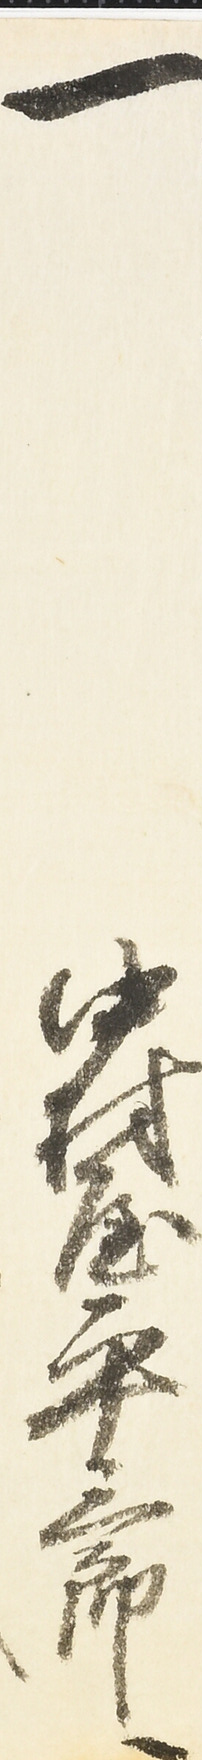一中村屋平三郎・
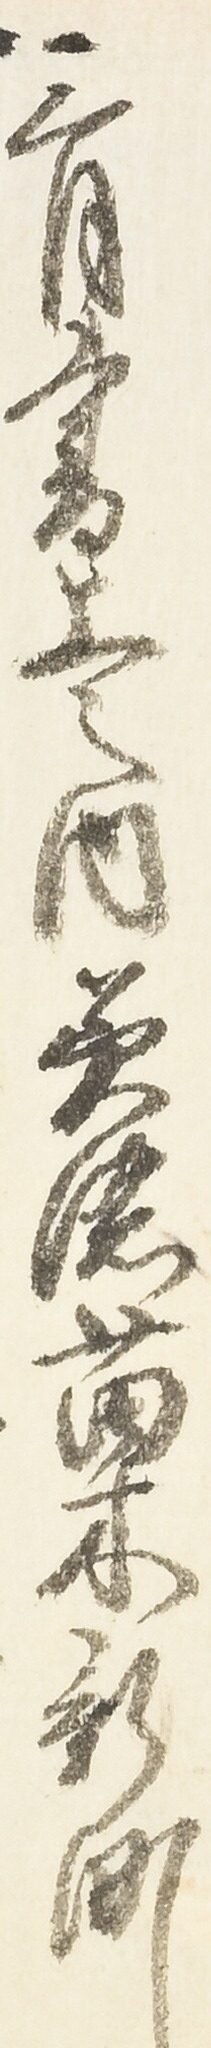三月書上之内美濃苗木新町
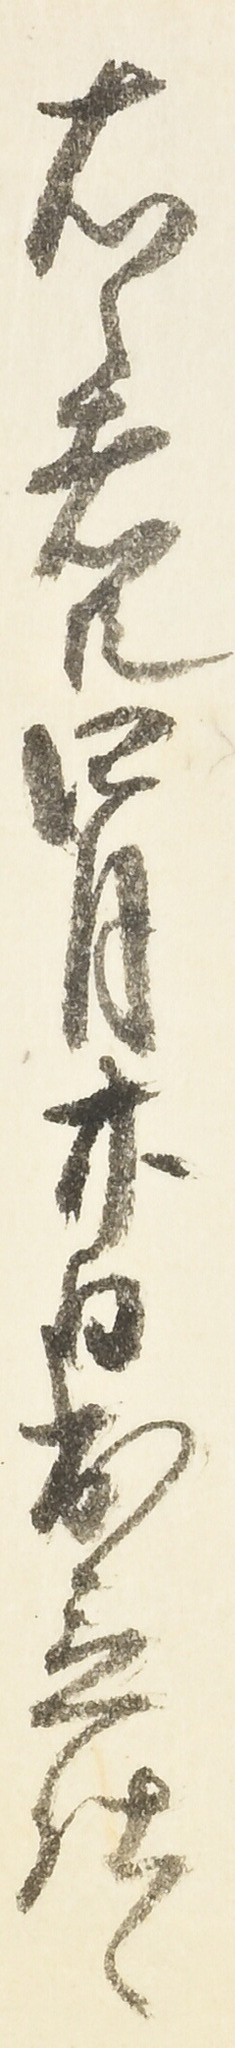右之者共四月廿日出立仕候
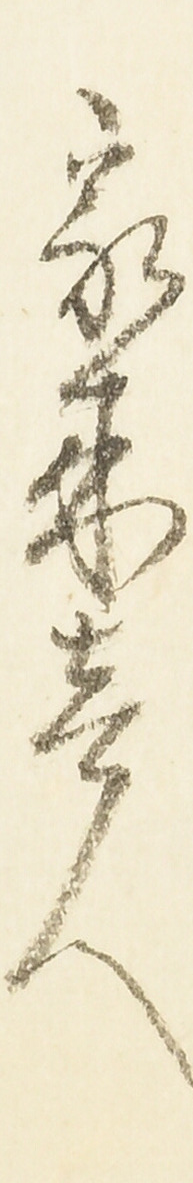家来壱人
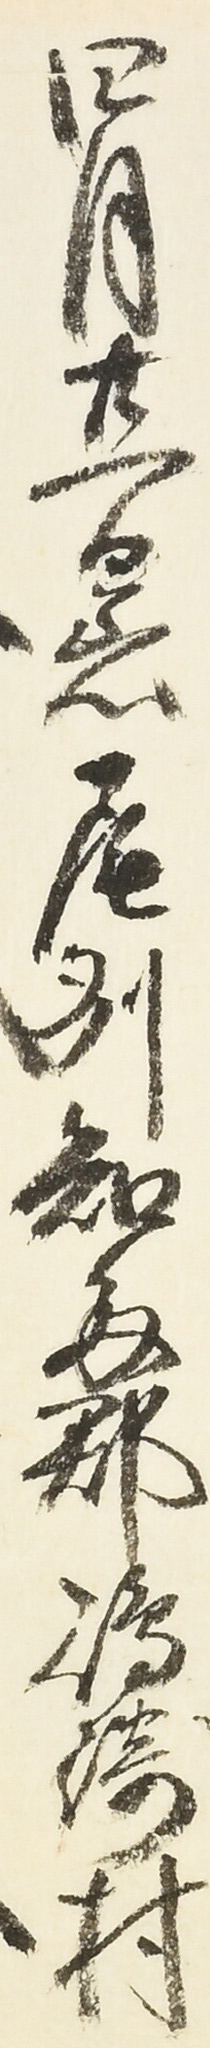四月廿一日着尾州知多郡嶋崎村
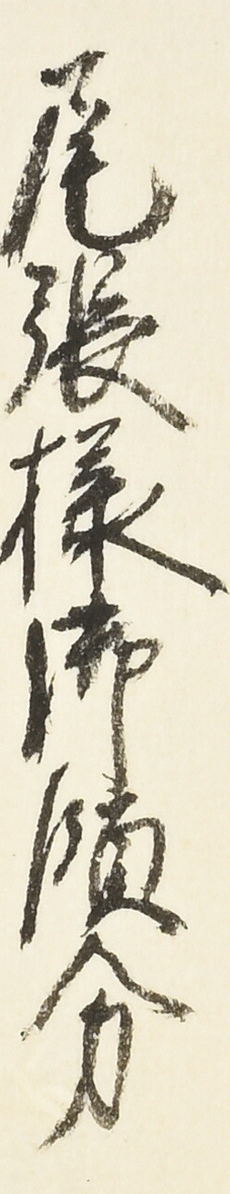尾張様御領分
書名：町中旅人泊控帳
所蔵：伊那市立高遠町図書館・合同会社AMANE
